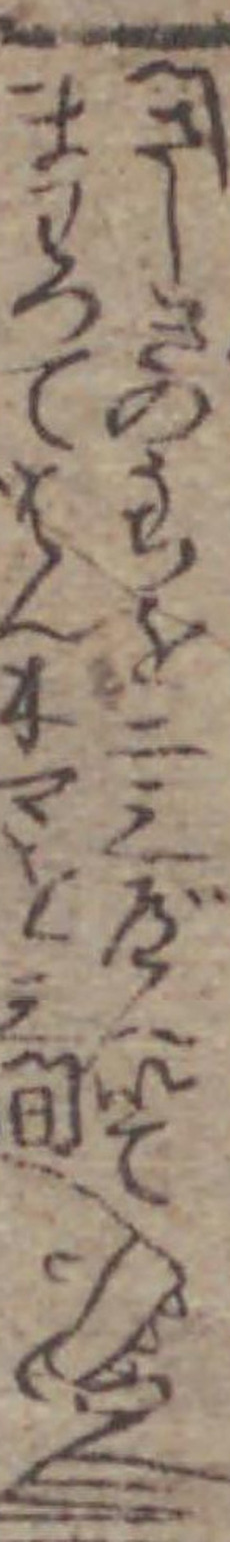まわつてはん木やを三間
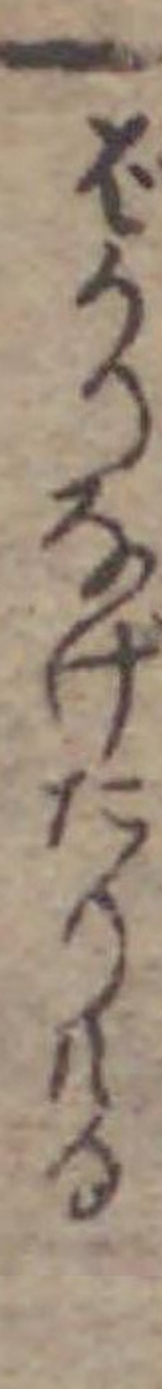ばかりなげたりける

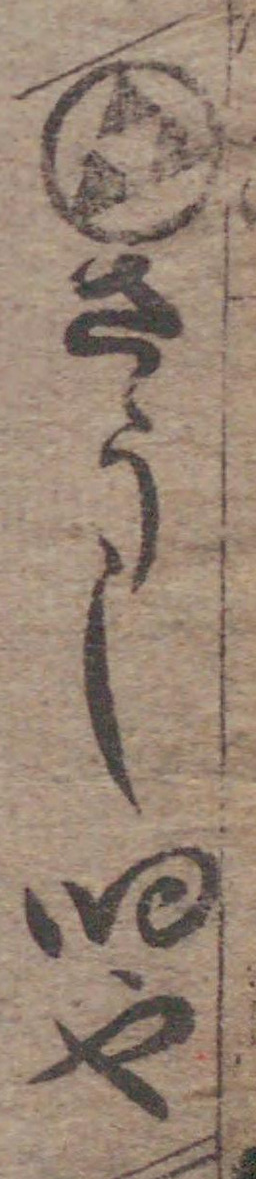さうし問や
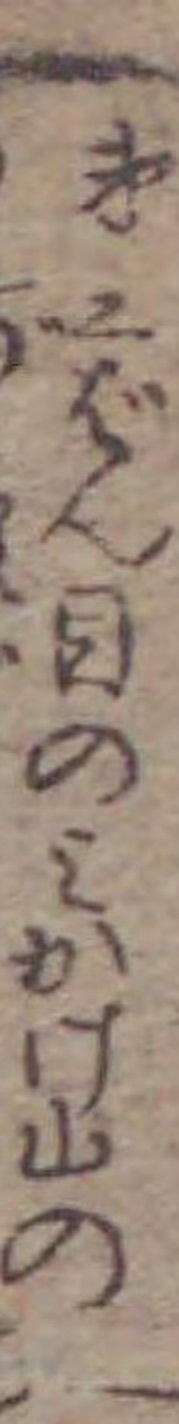第三ばん目のみかけ山の
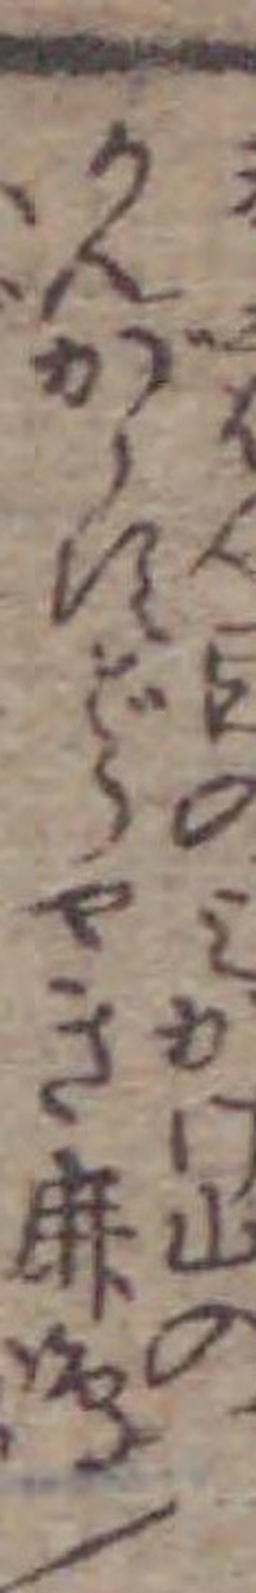かんからすどらやき鹿島
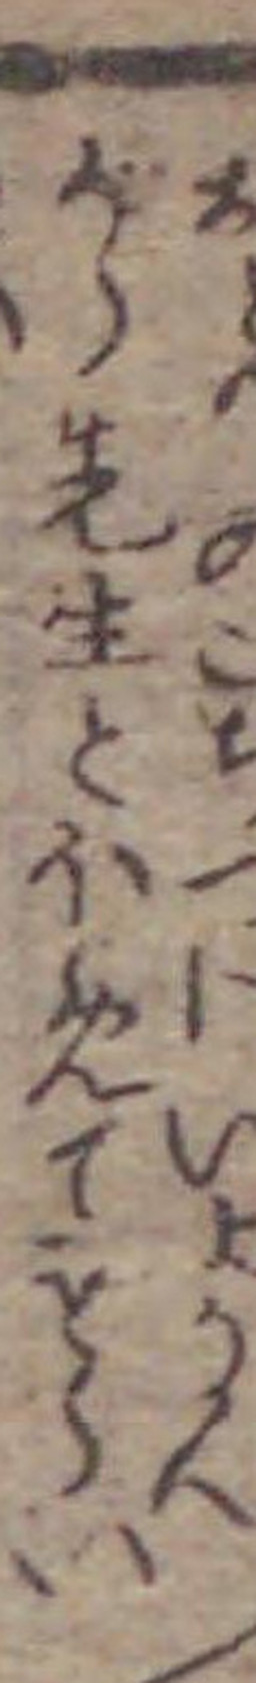がら先生とほめてもらい
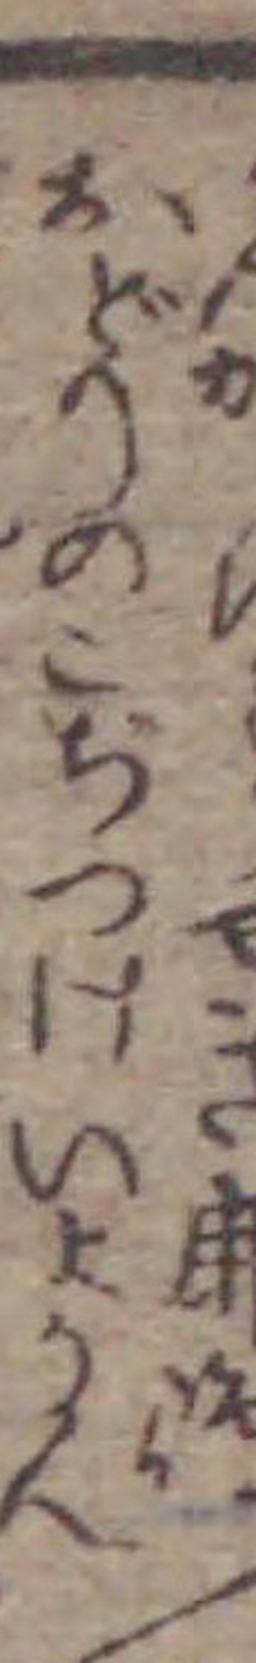おどりのこぢつけいようかん
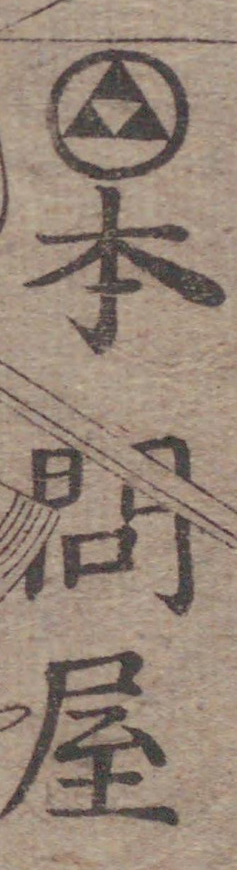本問屋
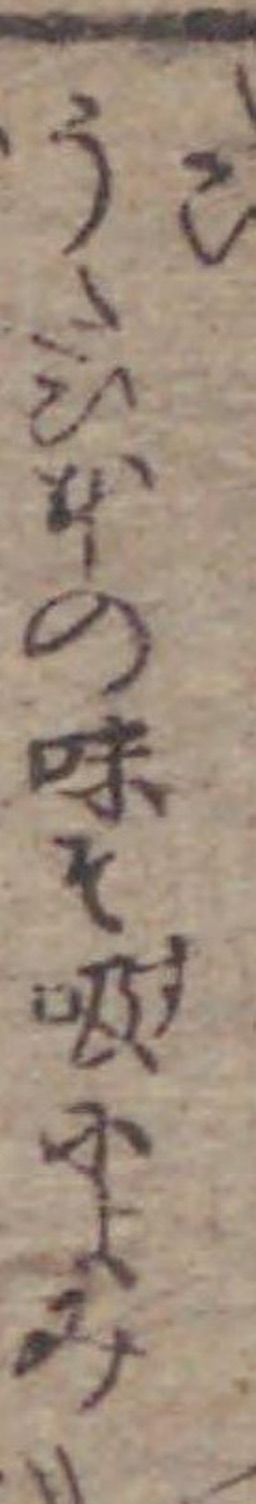うたひ本の味そ吸によみ
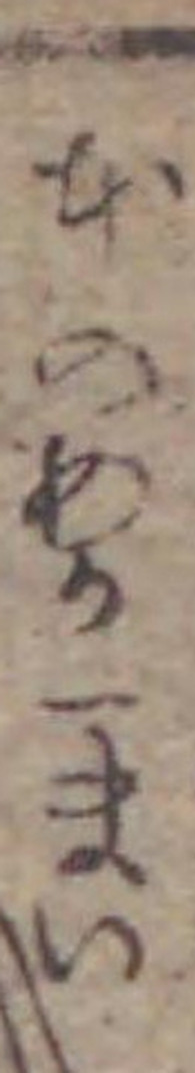本のあか一まい
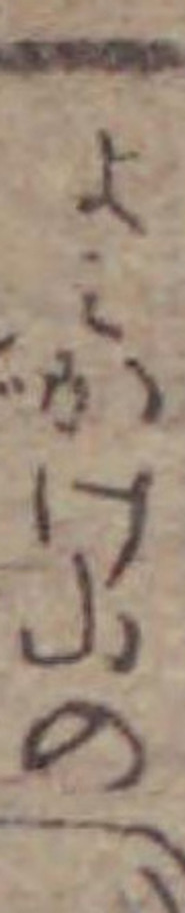よみかけ山の
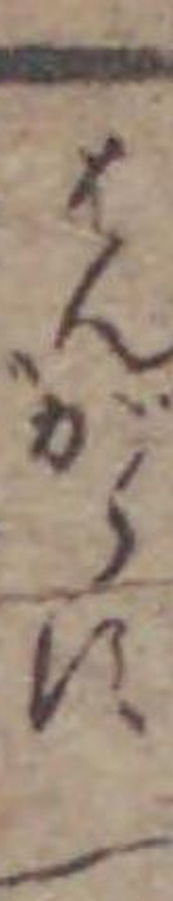はんがらす
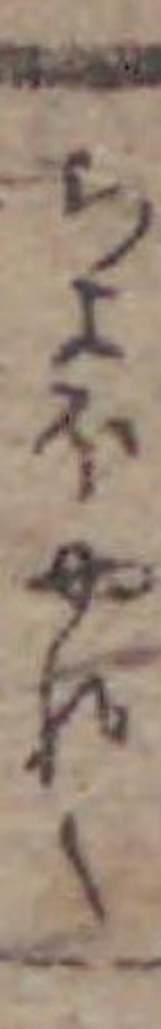ちよぼやれ〳〵
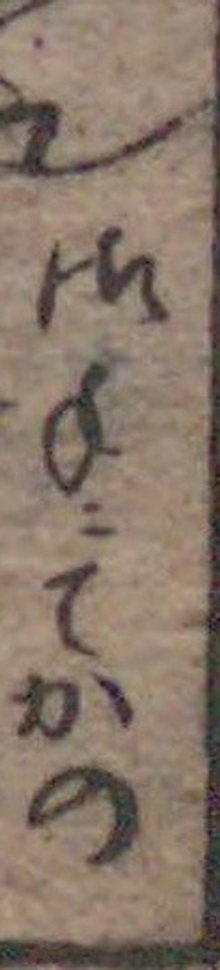御手にてかの
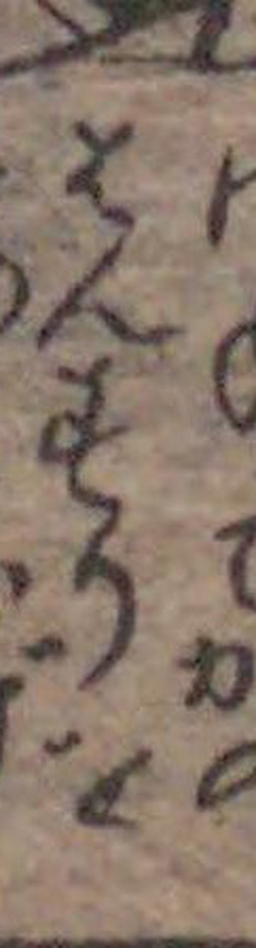はんすりを
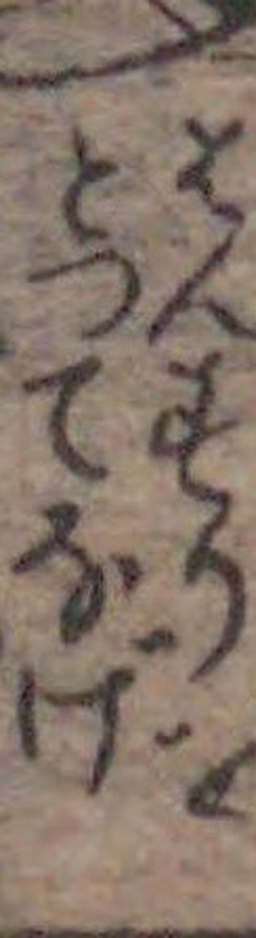とつてなげ
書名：辞闘戦新根 （国会）
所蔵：国立国会図書館 National Diet Library, JAPAN
